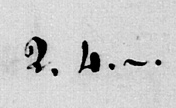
2. 4. –.
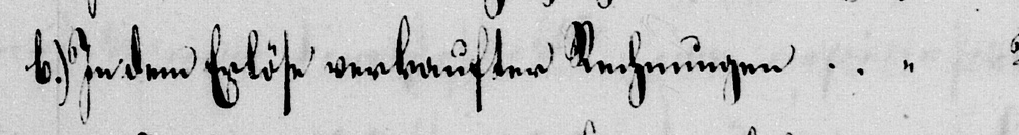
b.) In dem Erlöse verkaufter Rechnungen
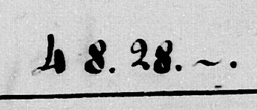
48. 28. –.
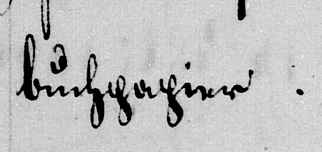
buchpapier
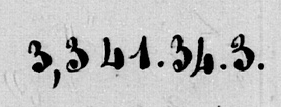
3,341. 34. 3.
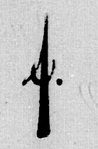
R.
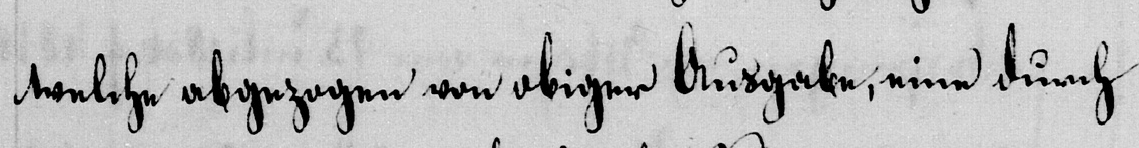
welche abgezogen von obiger Ausgabe, eine durch
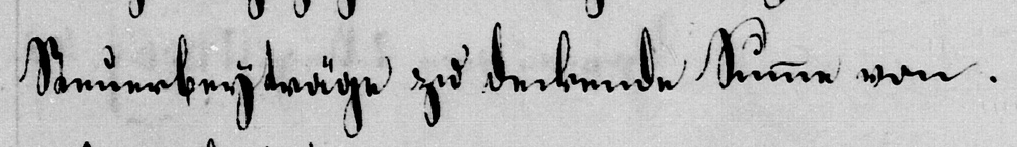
Steuerbeyträge zu deckende Summe von
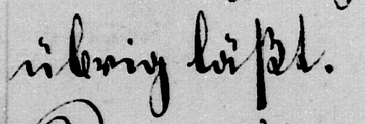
übrig lässt.
